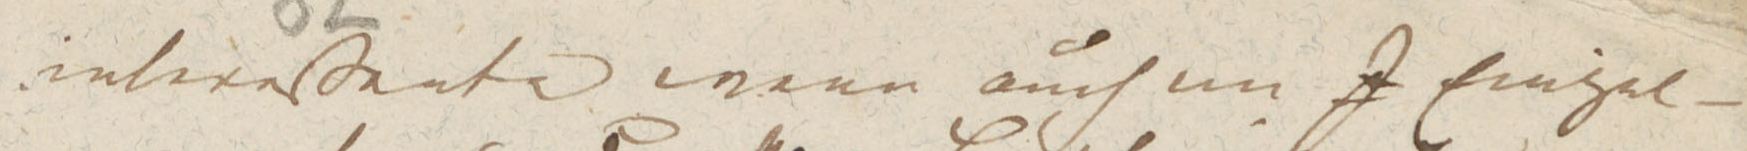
interessante wenn auch im I Einzel-
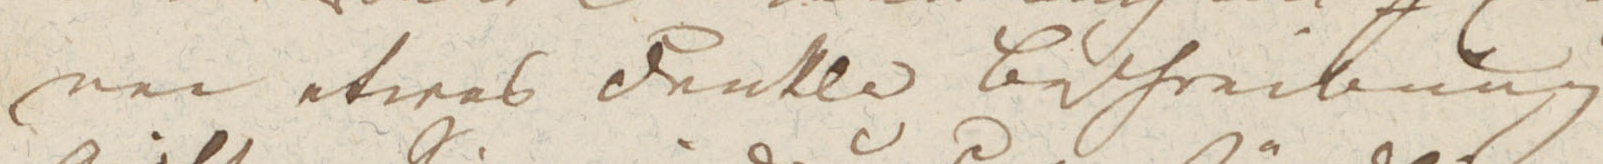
nen etwas dunkle Beschreibung
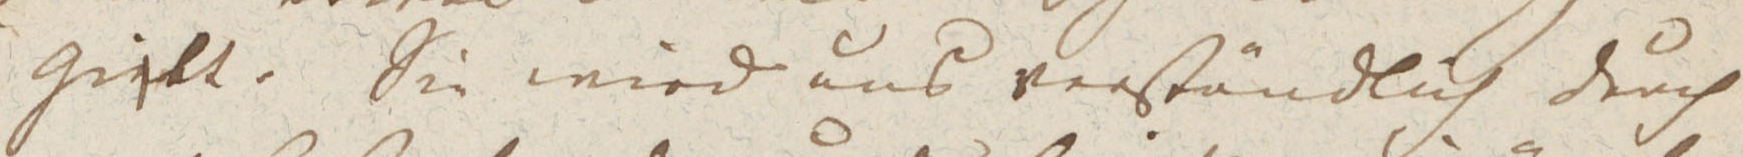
giebt. Sie wird uns verständlich durch
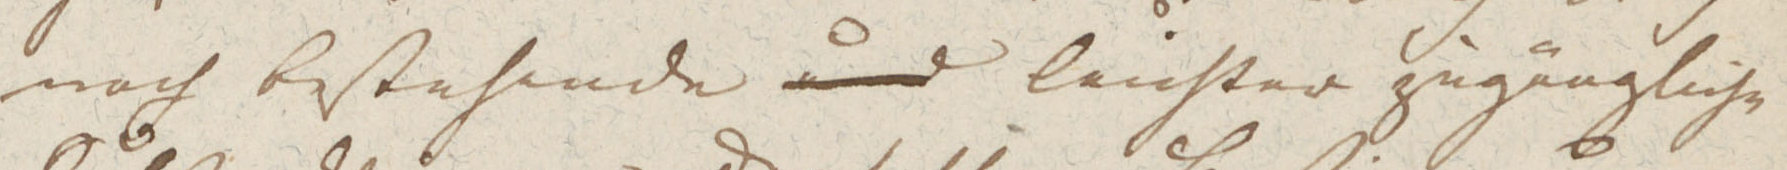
noch bestehende und leichter zugängliche
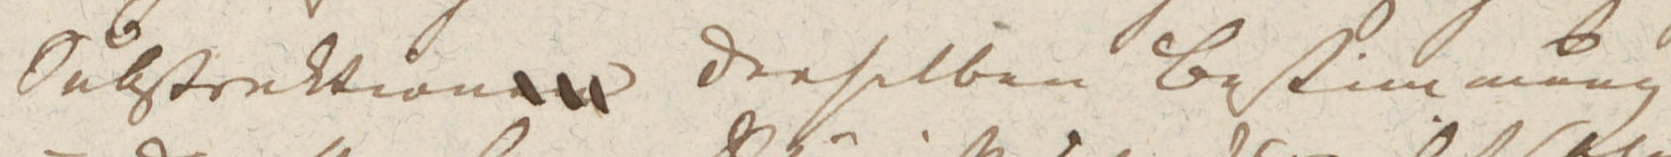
Substruktionen derselben Bestimmung
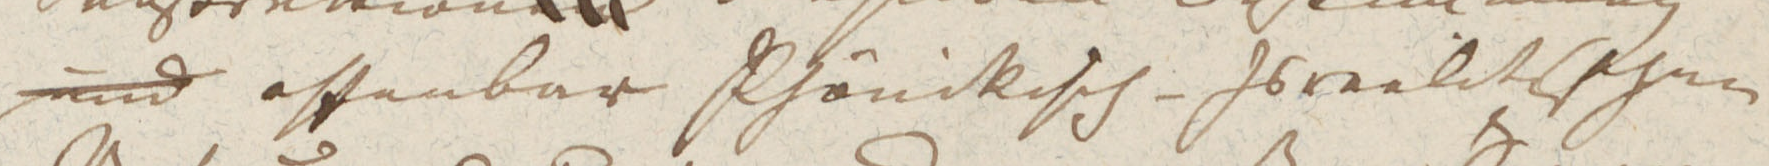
und offenbar Phönikisch-Israelitischen
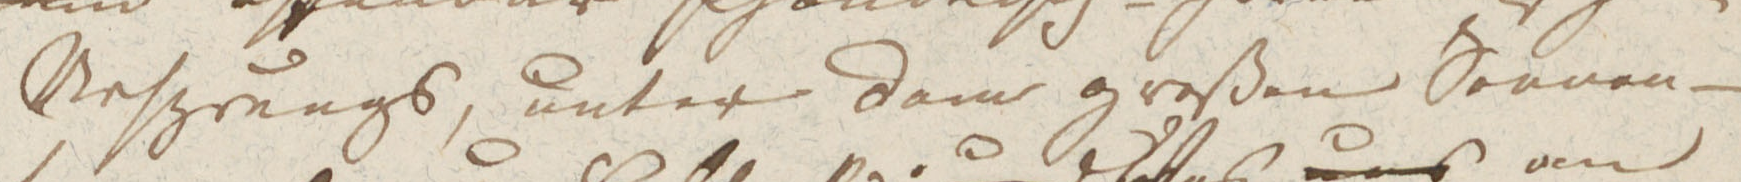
Ursprungs, unter dem grossen Sonnen-
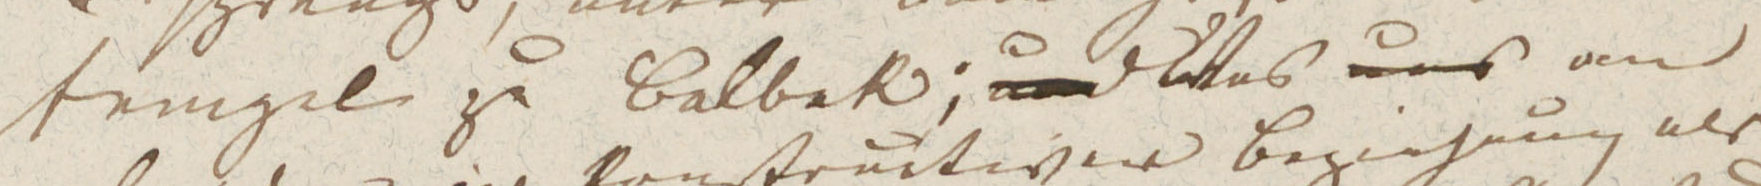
tempel zu Balbek; und wWas uns an
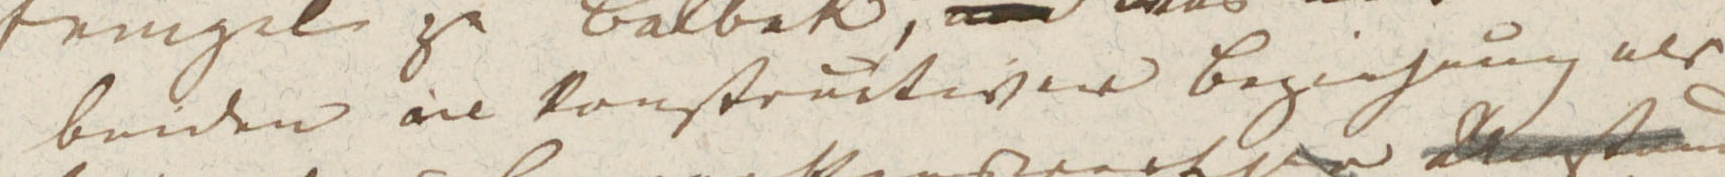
beiden in konstructiver Beziehung als
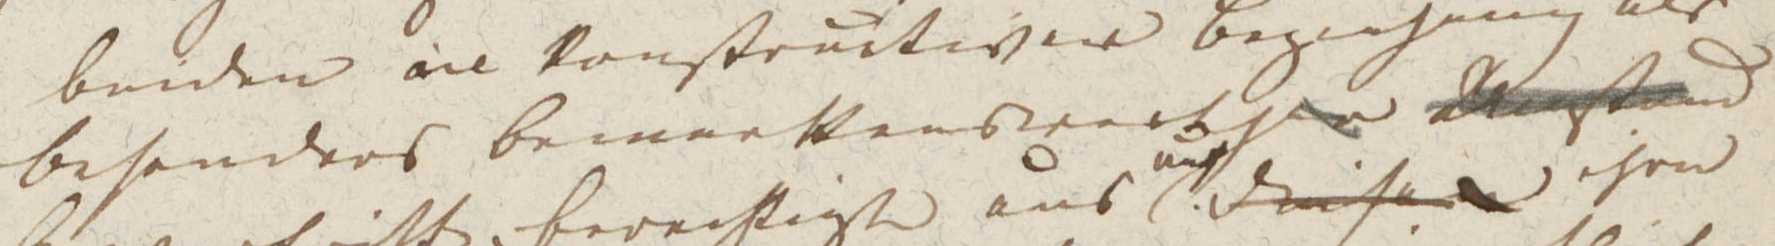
besonders bemerkenswerther Umstand
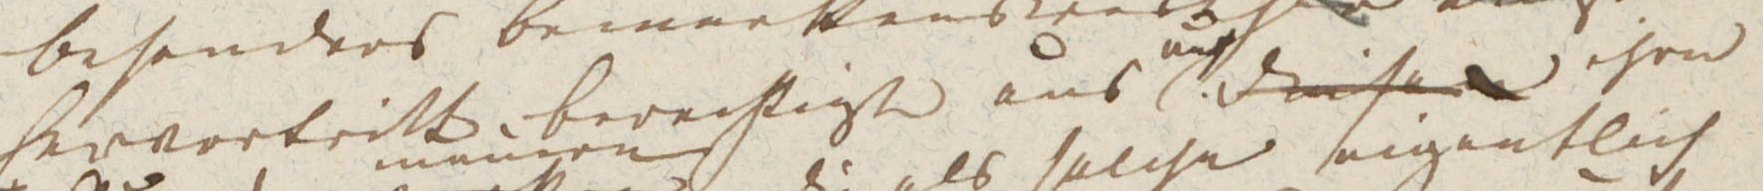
hervortritt berechtigt uns auf diesen ihre
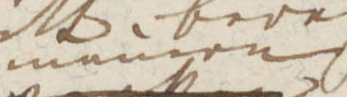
gigantischen %
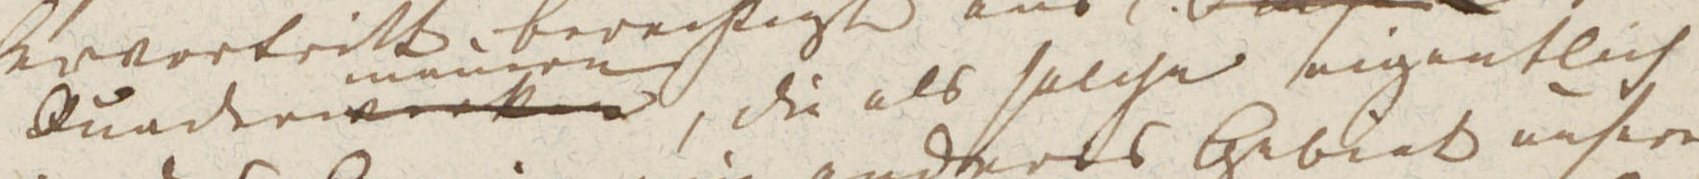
Quaderwerkenmauern, die als solche eigentlich
